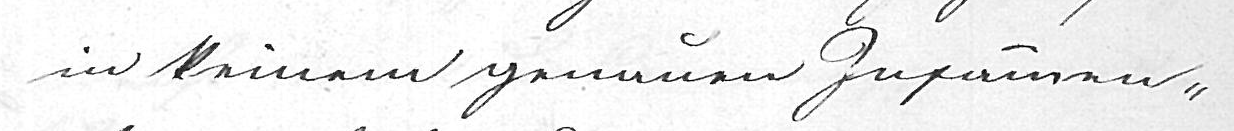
in keinem genauen Zusammen-
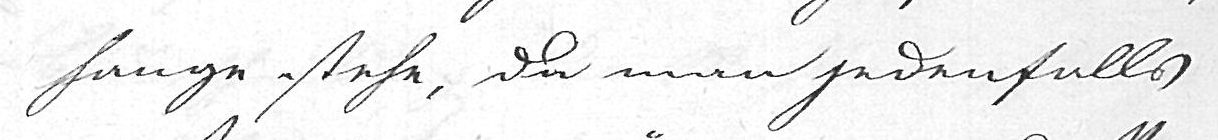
hange stehe, die man jedenfalls
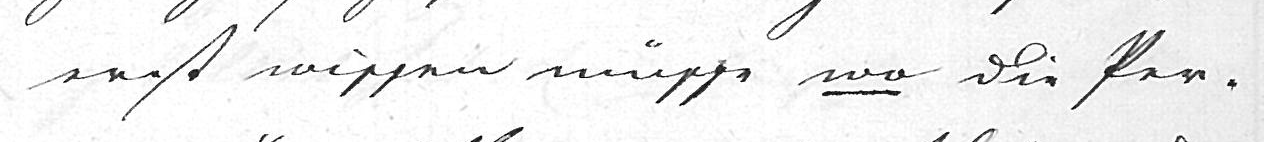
erst wissen müsse wo die Per-
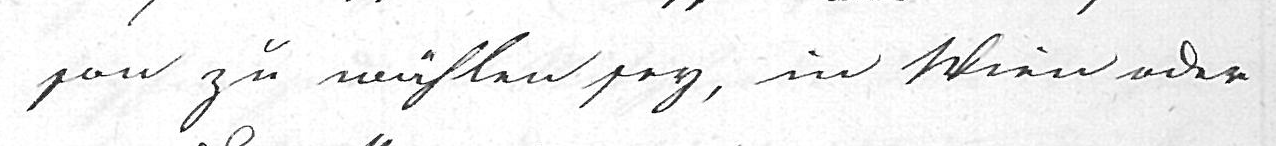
son zu wählen sey, in Wien oder
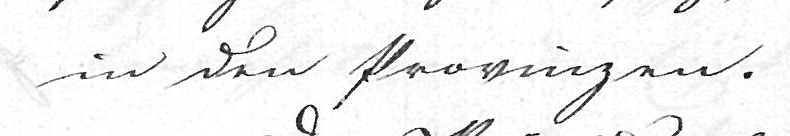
in den Provinzen.
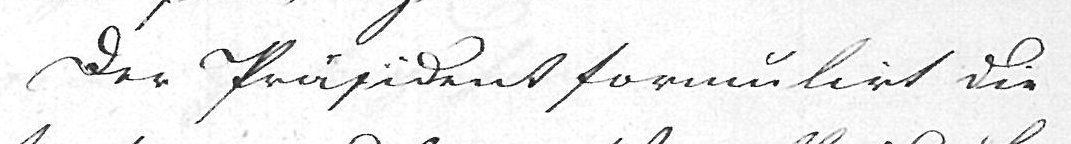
Der Präsident formulirt die
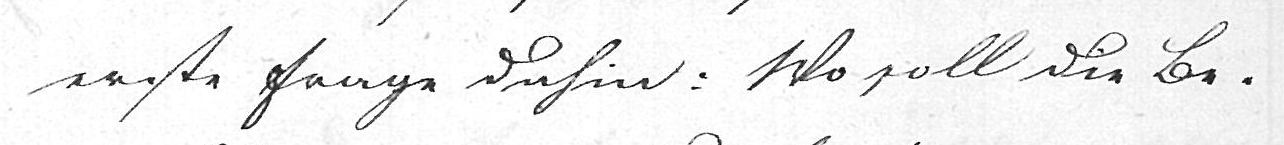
erste Frage dahin: Wo soll die Be-
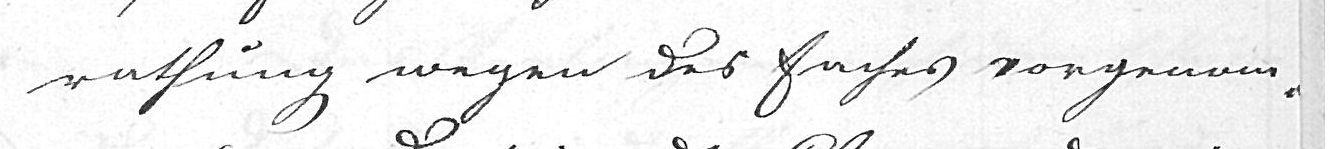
rathung wegen des Faches vorgenom-
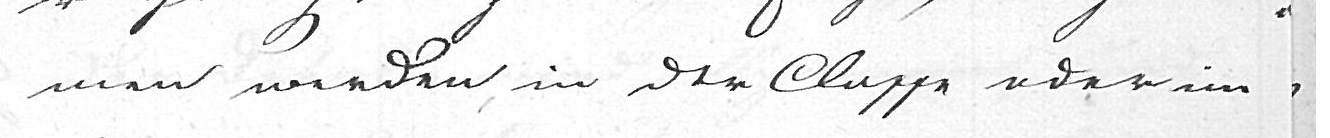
men werden, in der Classe oder im
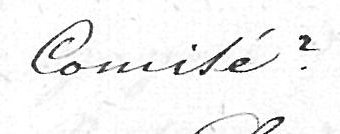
Comité?
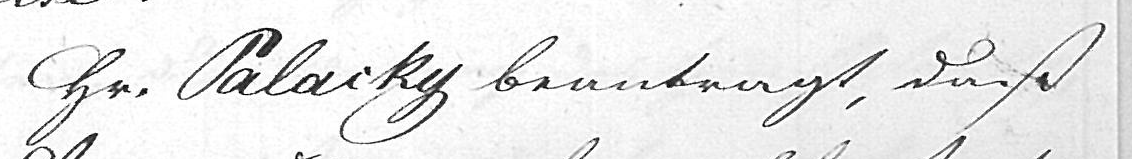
Hr. Palacky beantragt, daß
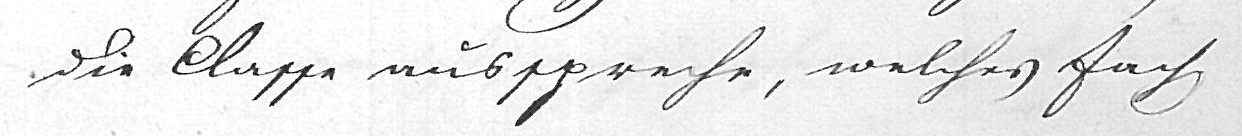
die Classe ausspreche, welches Fach
